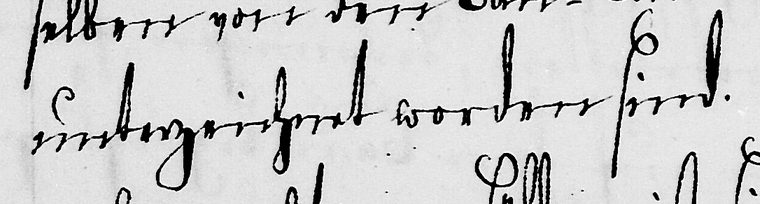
unterzeichnet worden sind.
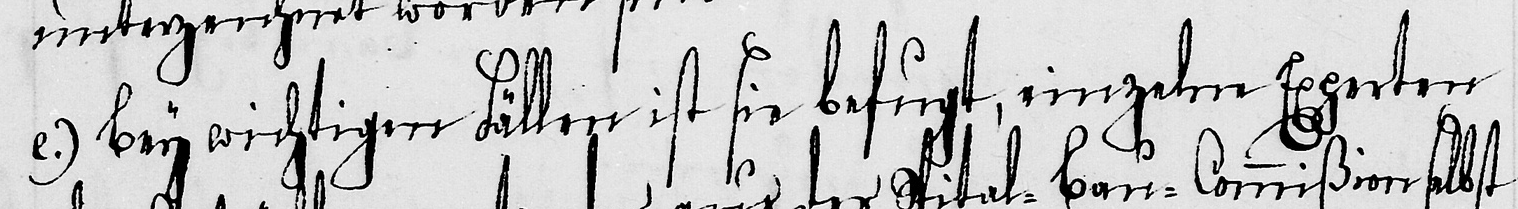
e.) Bey wichtigen Fällen ist sie befugt, einzelne Experten
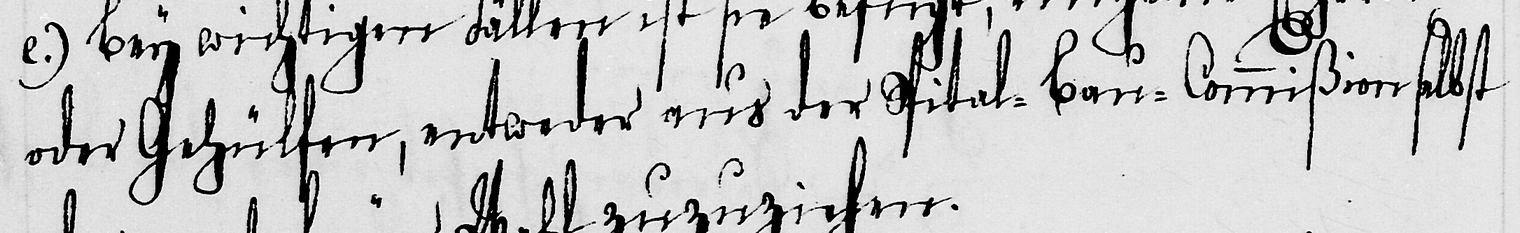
oder Gehülfen, entweder aus der Spital-Bau-Commißion selbst
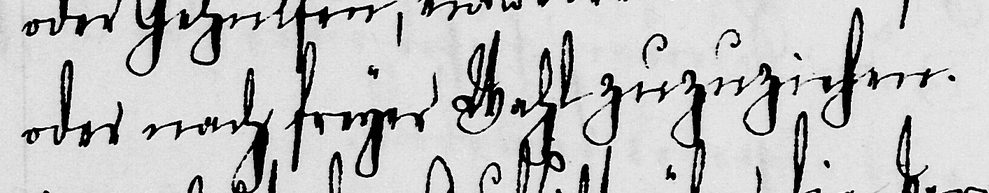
oder nach freyer Wahl zuzuziehen.
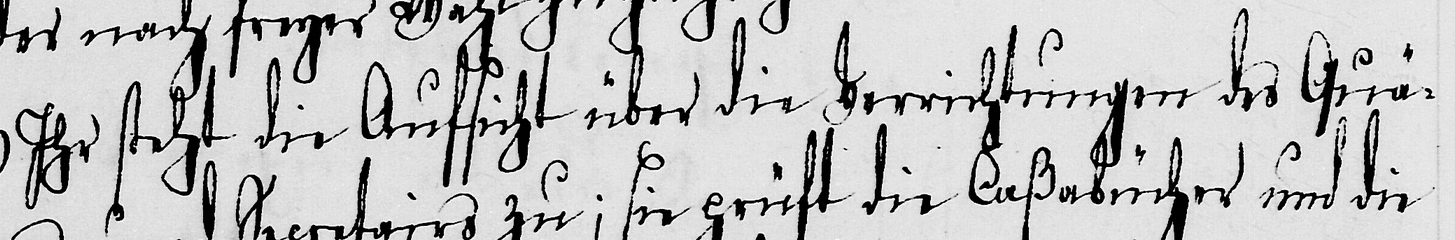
Ihr steht die Aufsicht über die Verrichtungen des Quä¬
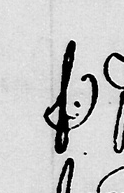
ob.
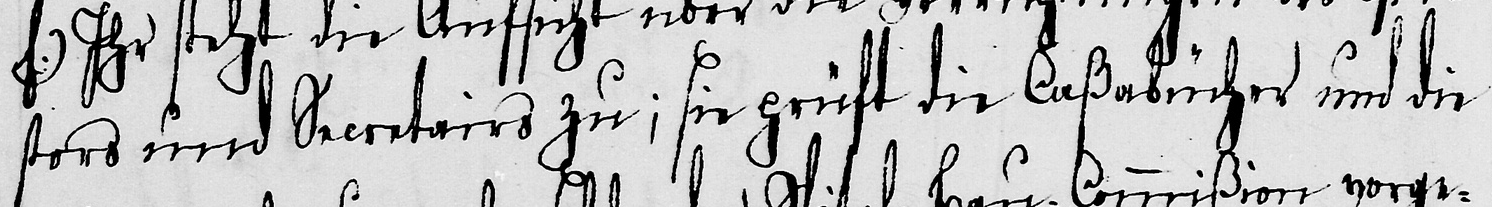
stors und Secretairs zu; sie prüft die Caßabücher und die
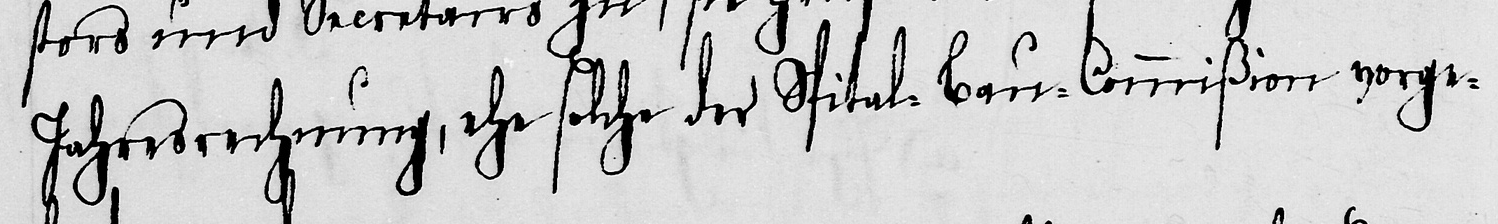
Jahresrechnung, ehe solche der Spital-Bau-Commißion vorge¬
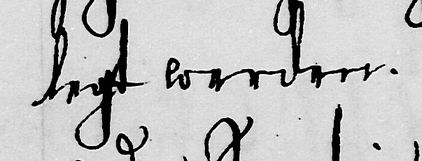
legt werden.
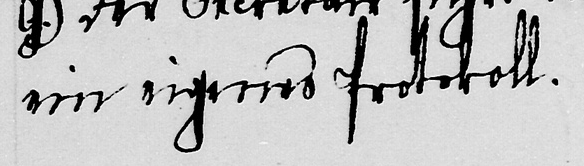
ein eigenes Protokoll.
